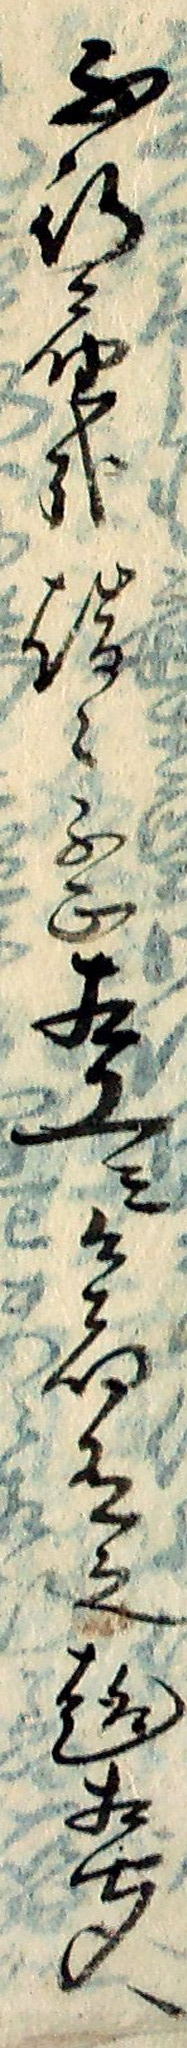不行届哉端々不正相工み候者有之趣相聞へ
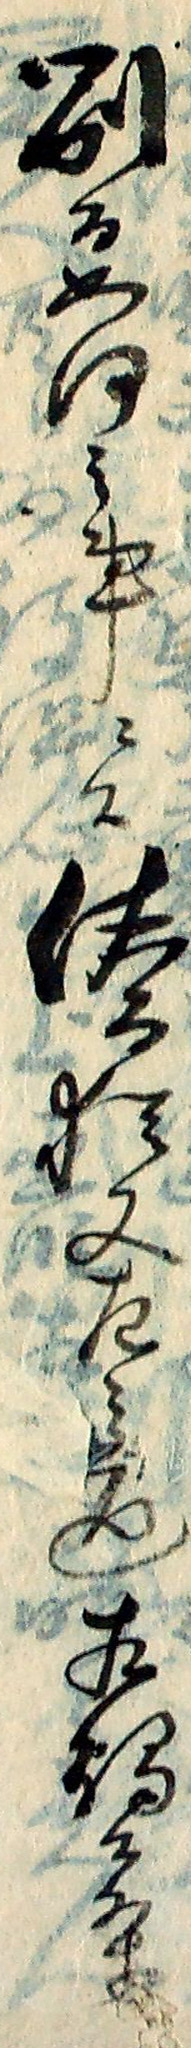別て如何之事に候依て猶又左之通相触候条
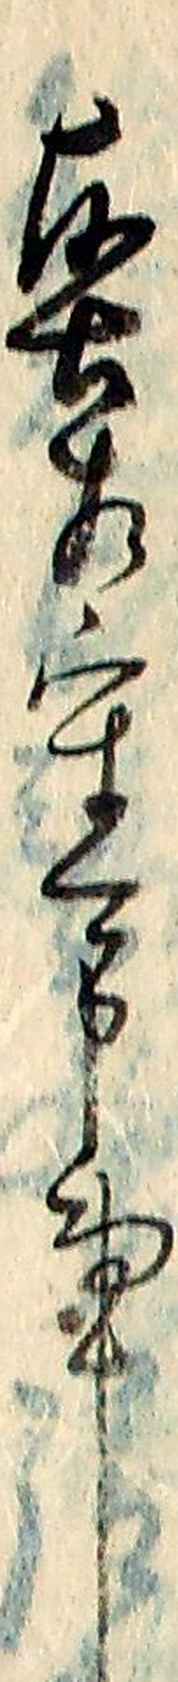堅相守可申事

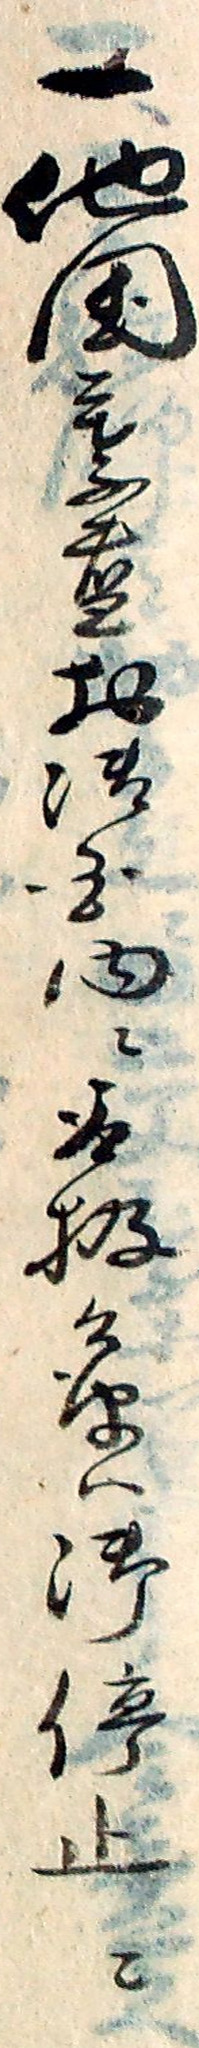一他国葉藍於御国内に取扱候儀は御停止に
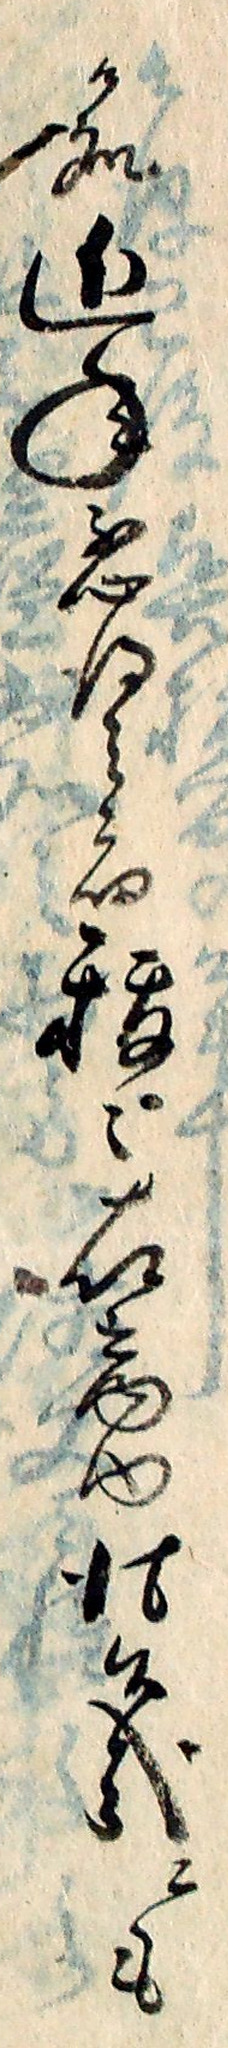候処近年不心得之者抜々右商内仕候哉にも
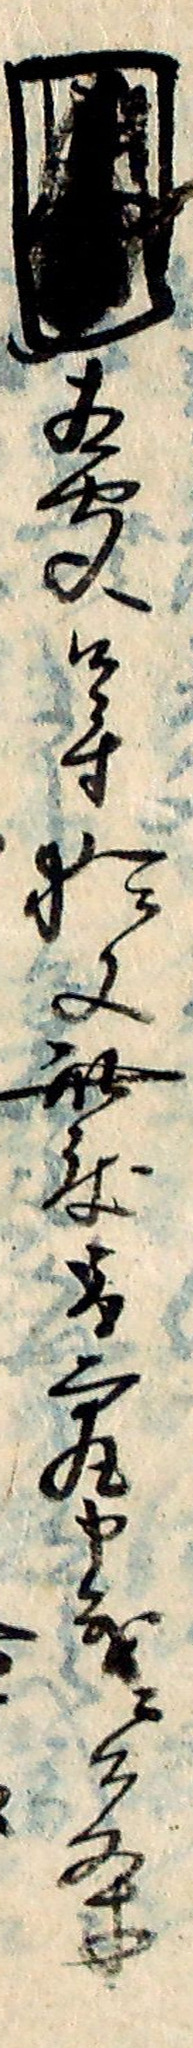相聞へ候付猶又此度取究申義に候条
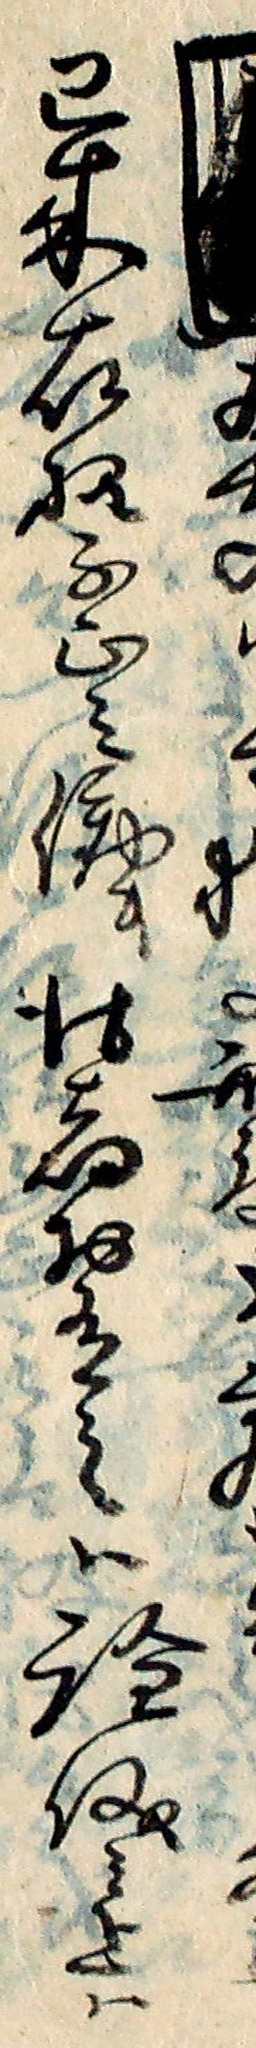已来右様不正之働き仕者於有之は詮儀之上は
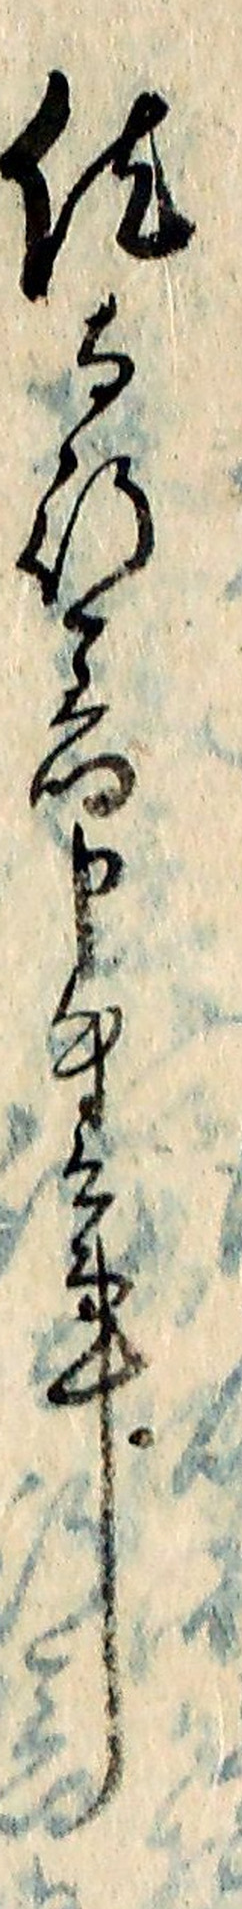然と行着申付候事
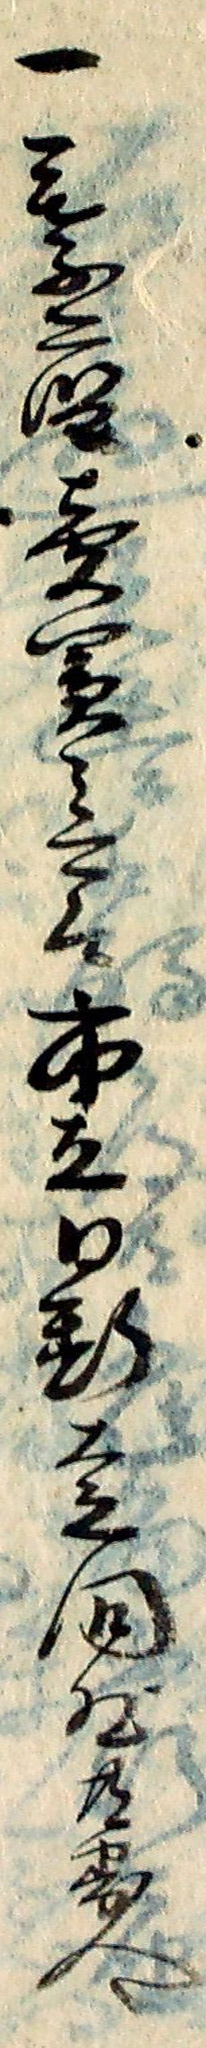一葉藍商売之節市立同断走問屋共寄合
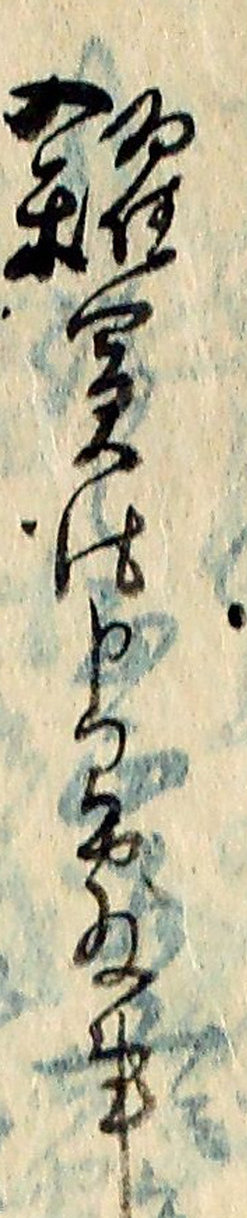糴買仕申間敷事
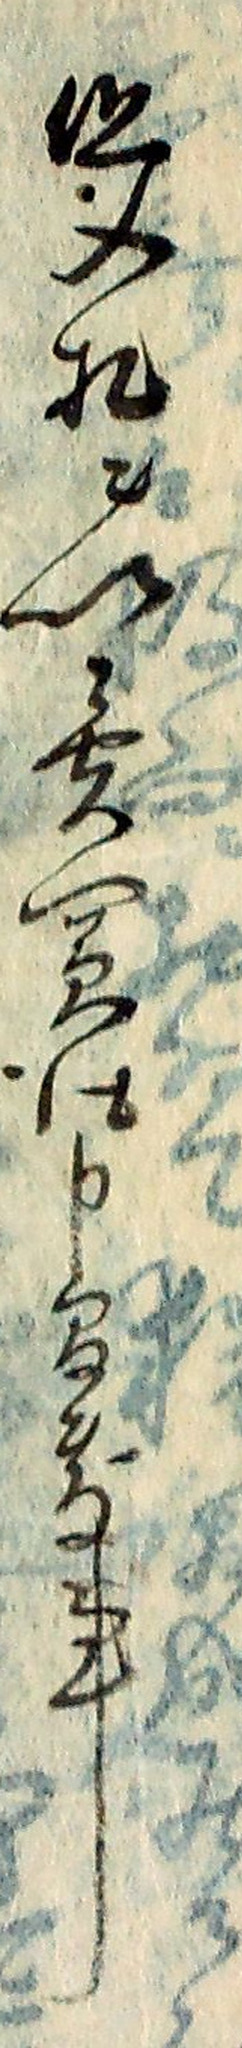但入札を以売買仕申間敷事
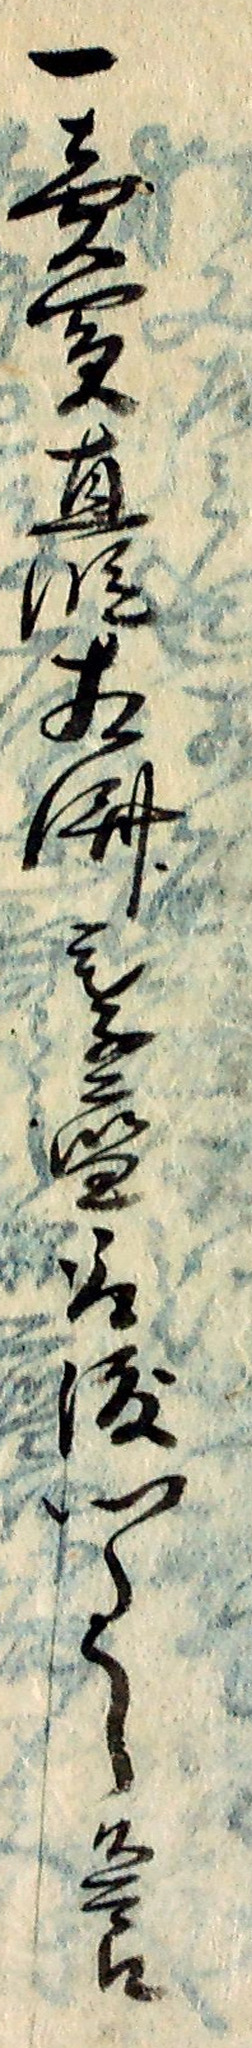一売買直段相済葉藍取渡いたし候節
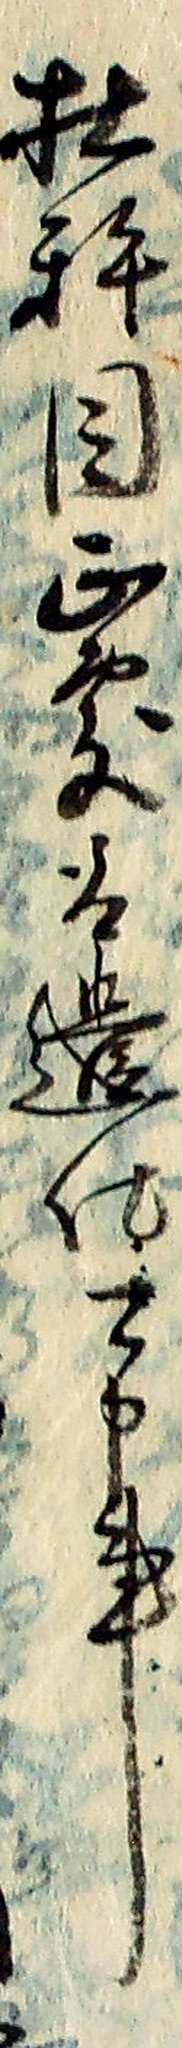在秤目正敷取遣仕可申事
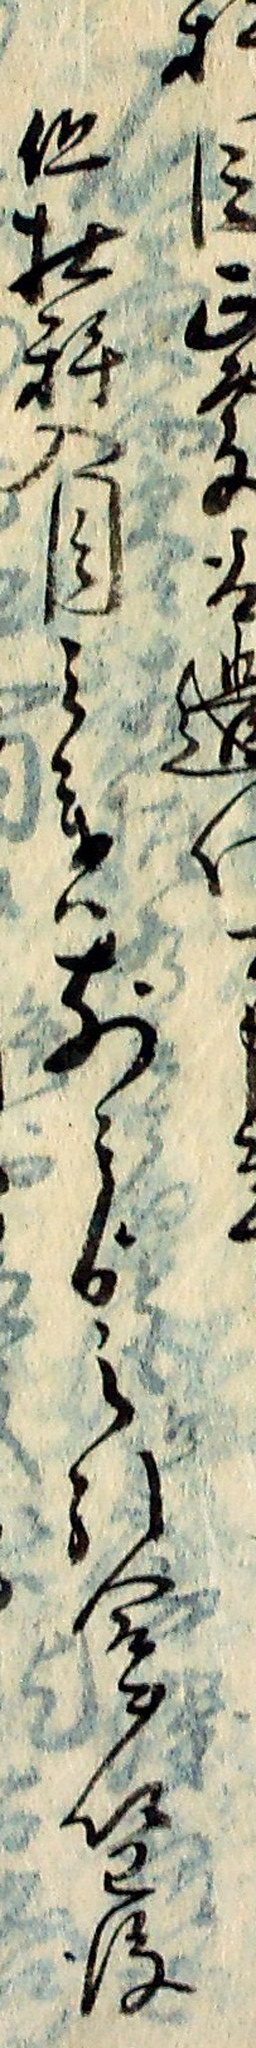但在秤入目之義は前々ゟ之引合を以已後
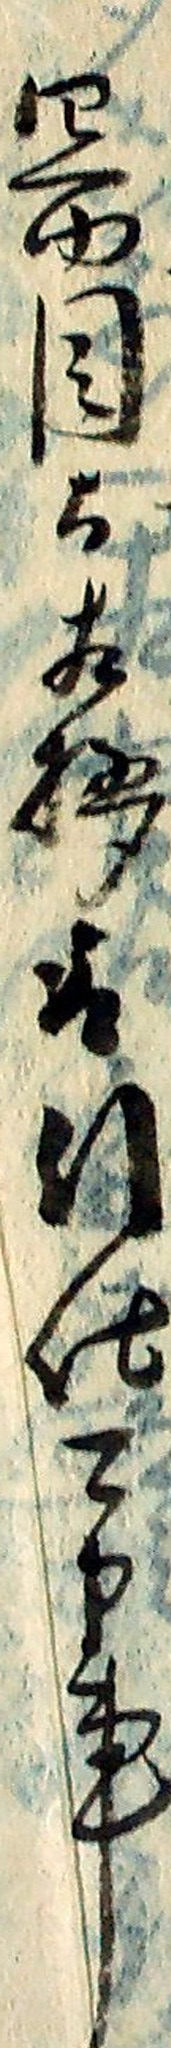四百目と相極め取引仕可申事
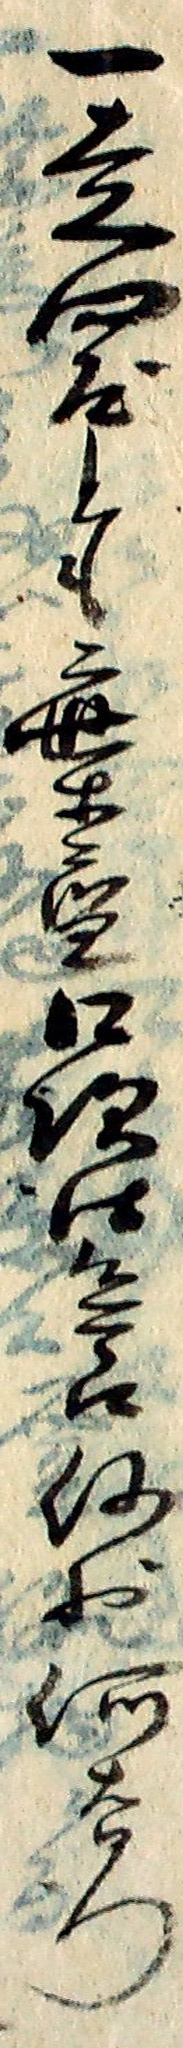一走問屋とも葉藍口次仕候節何村何右衛門
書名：諸御願書控(後藤氏壱番）
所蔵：鳴門教育大学 Naruto University of Education
